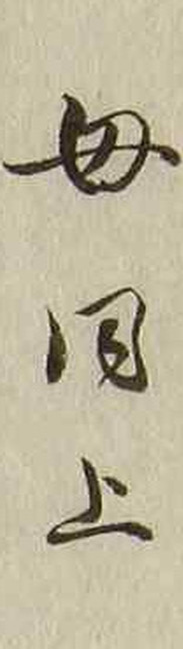母同上
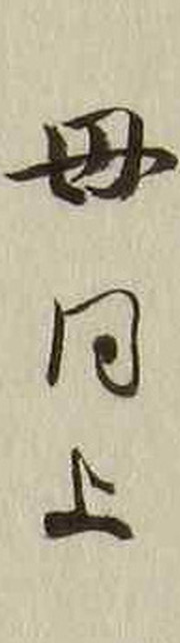母同上
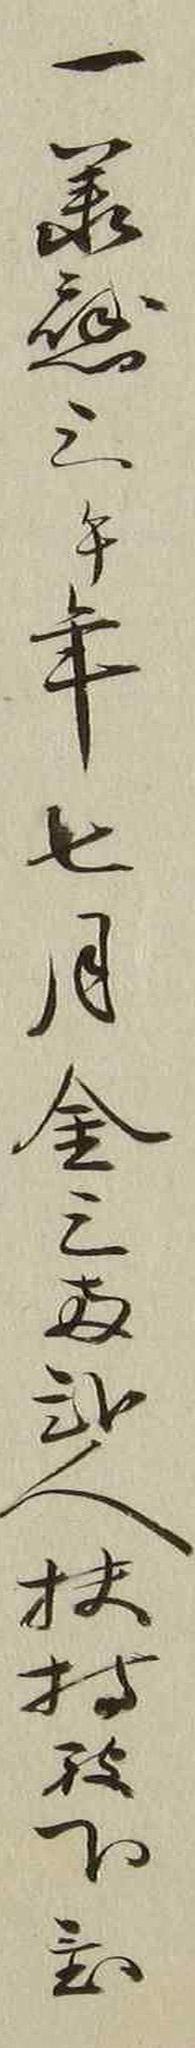一承応三午年七月金三両弐人扶持被下置
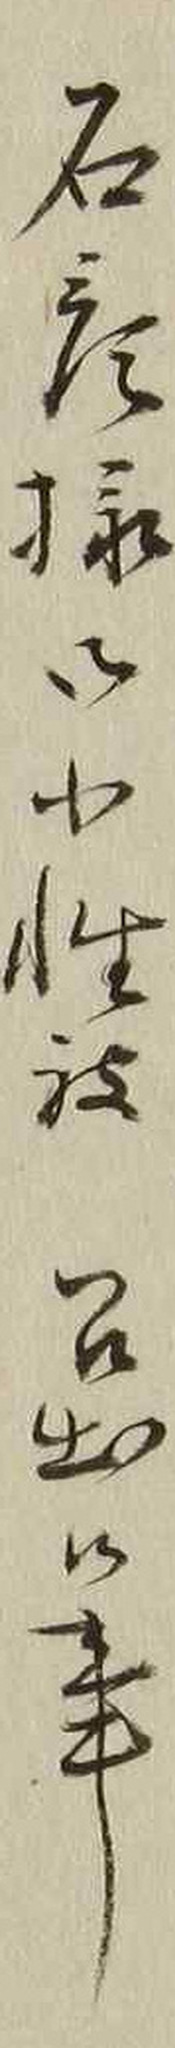石彦様御小性被召出候事
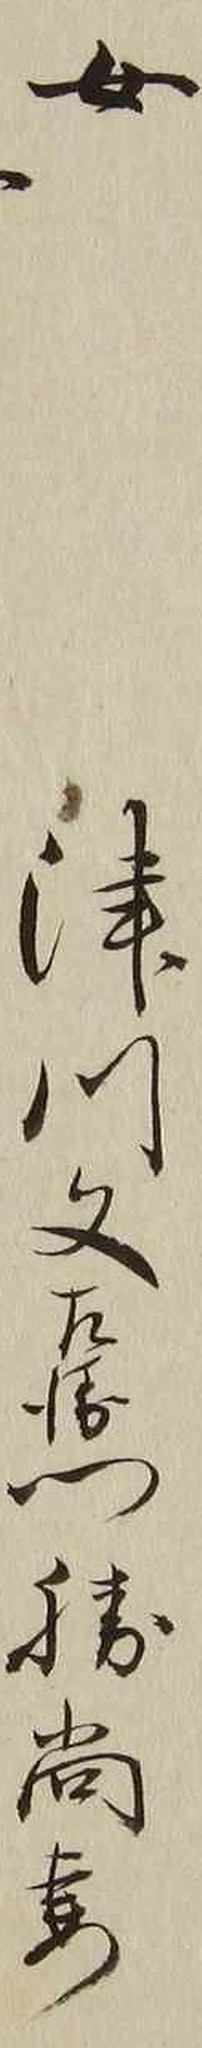女津川又左衛門勝尚妻
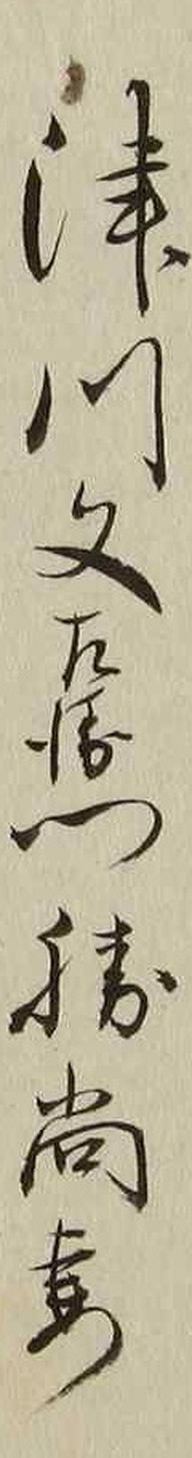女津川又左衛門勝尚妻
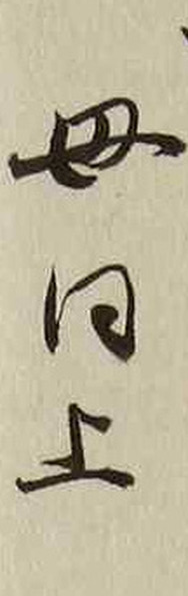母同上
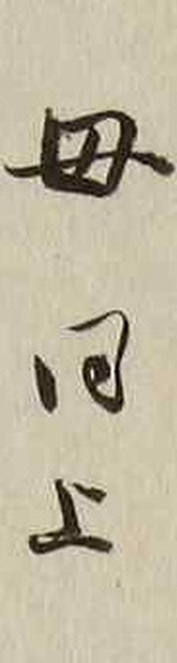母同上
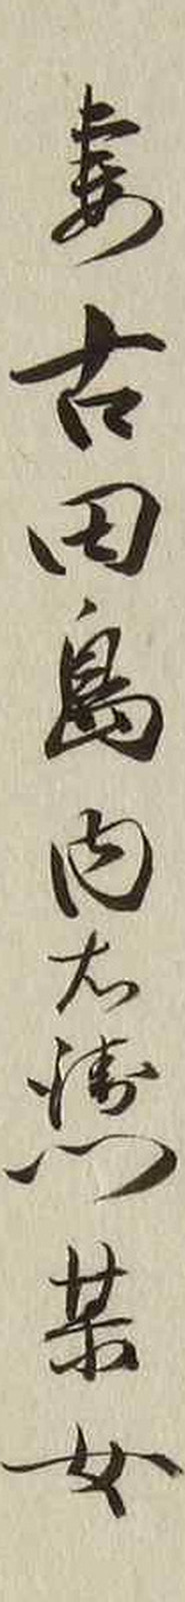妻古田島内右衛門某女
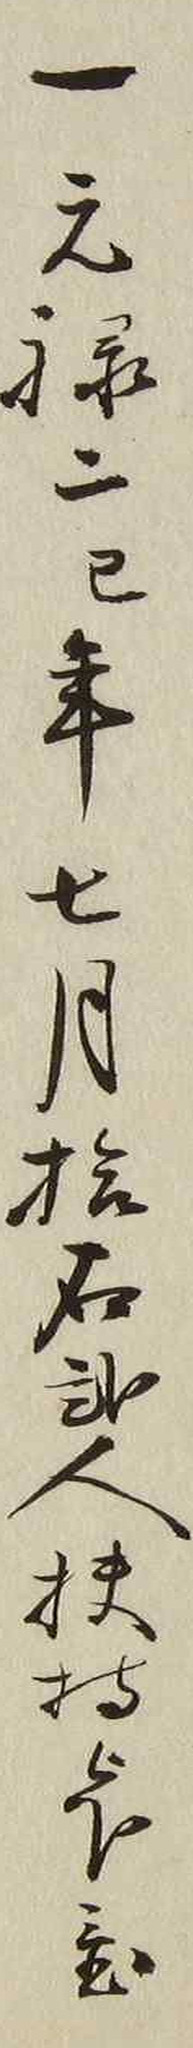一元禄二巳年七月拾石弐人扶持被下置
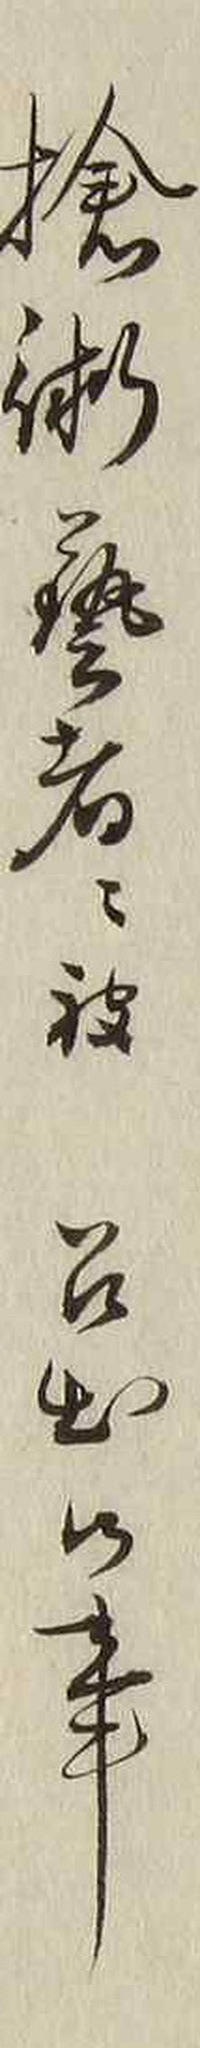槍術芸者に被召出候事
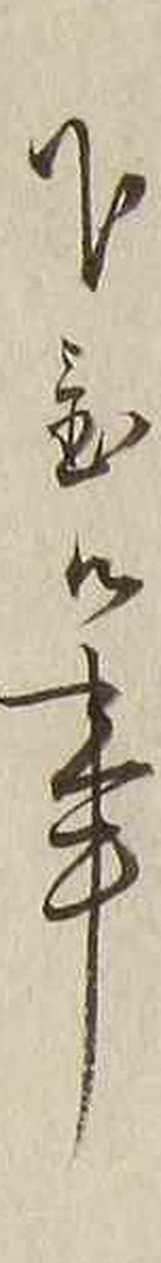下置候事
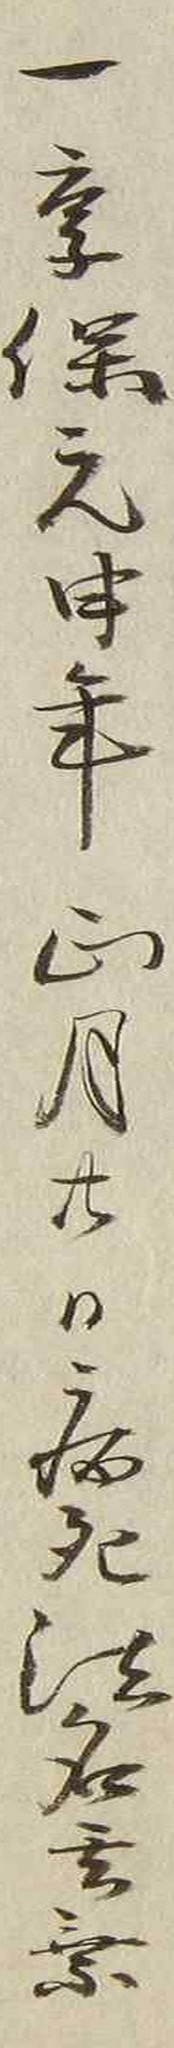一享保元申年正月廿日病死法名玄乗
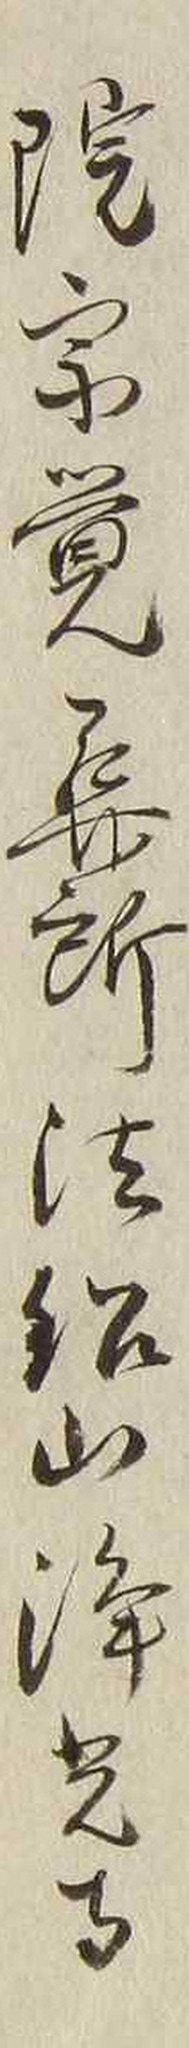院宗覚葬所法紹山浄光寺

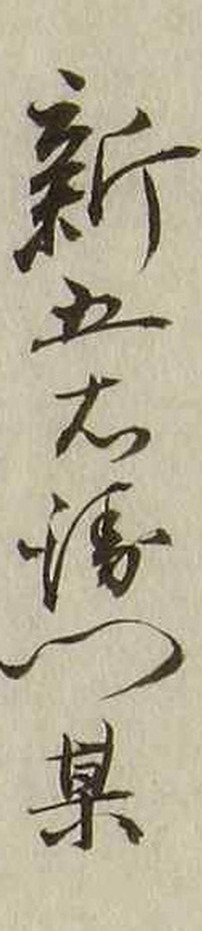新五右衛門某
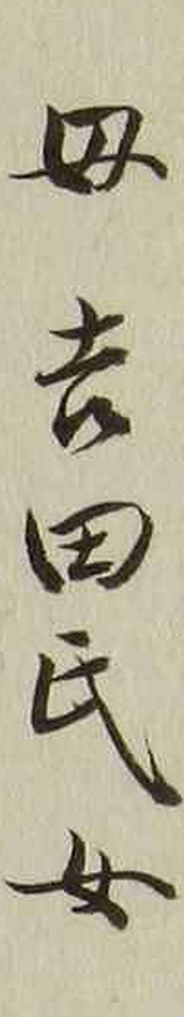母吉田氏女
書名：諸士系譜　巻之157　ね之部1
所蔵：会津若松市立会津図書館
